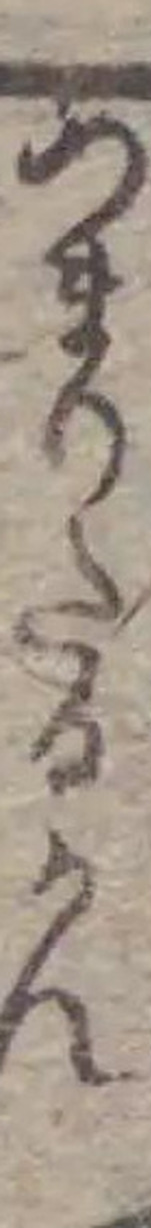つまりたるかん
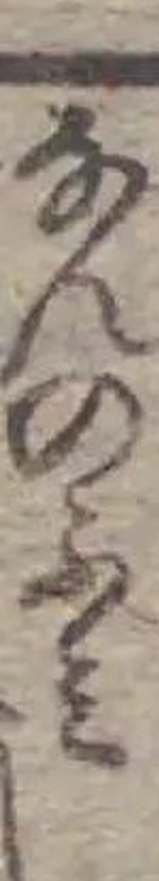なんのふみ
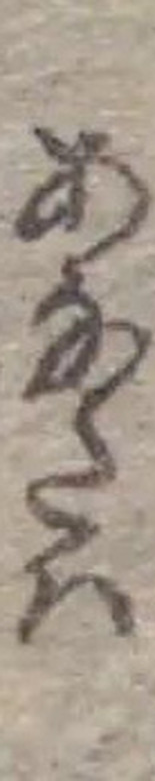あなたは
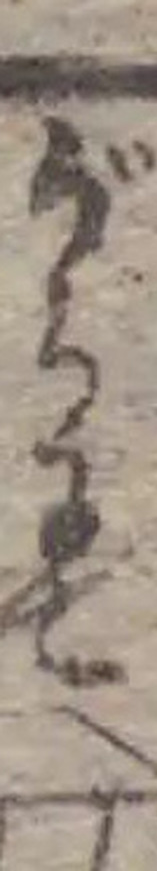がらにて
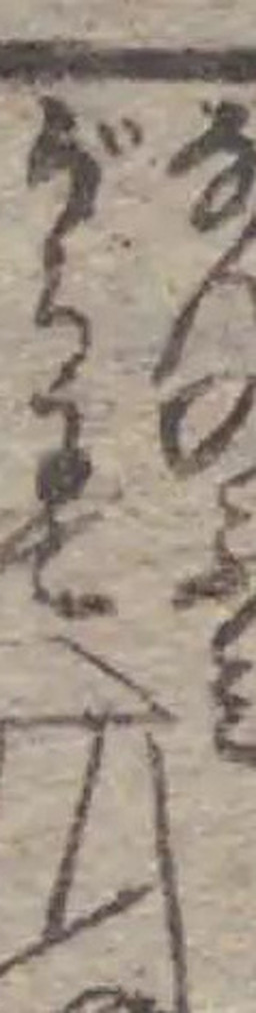がらにて
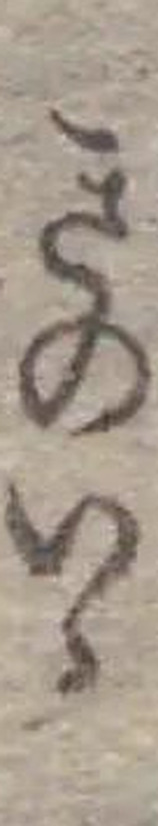きのいゝ
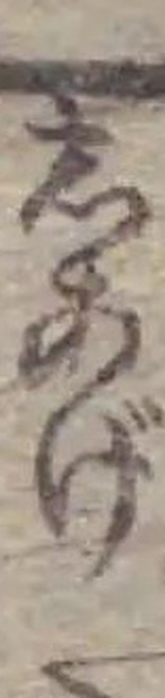しあげ
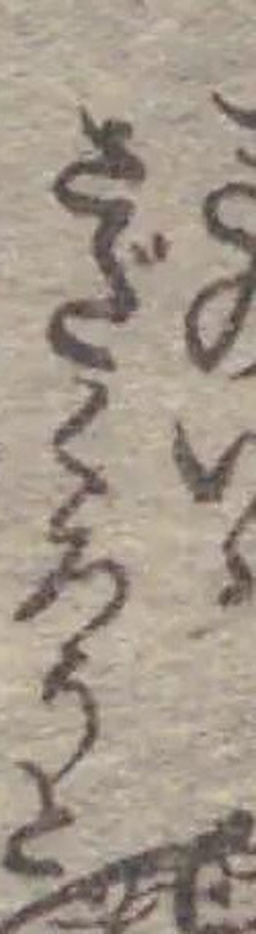さだくろうと
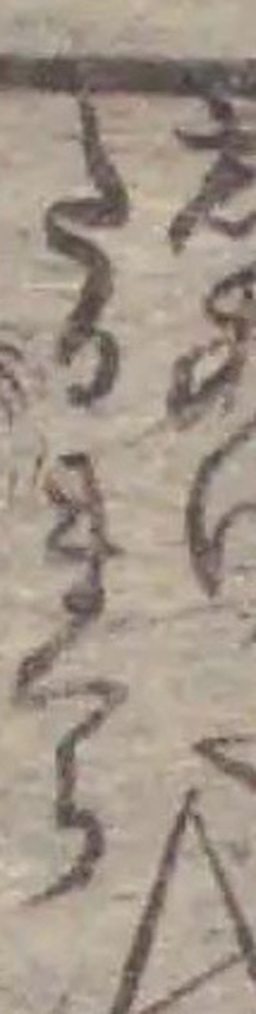たるまくら
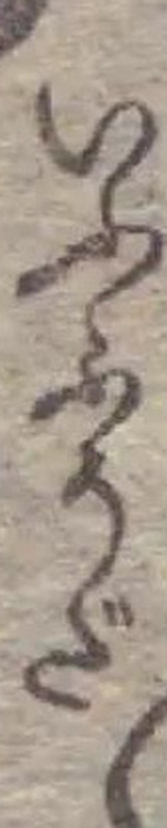いふふうだ
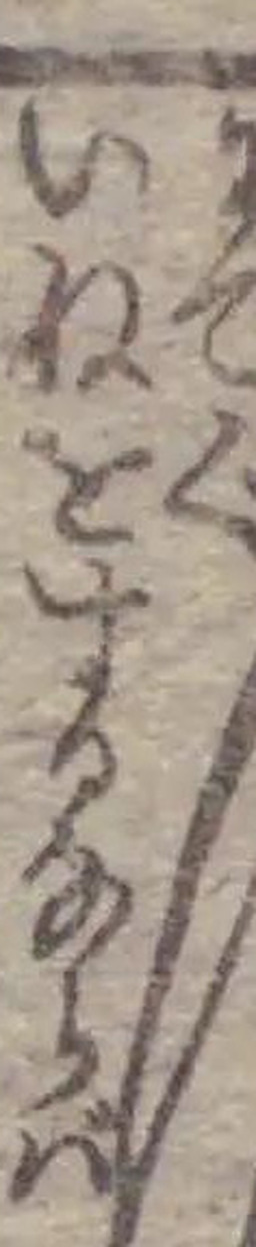いねをするならば
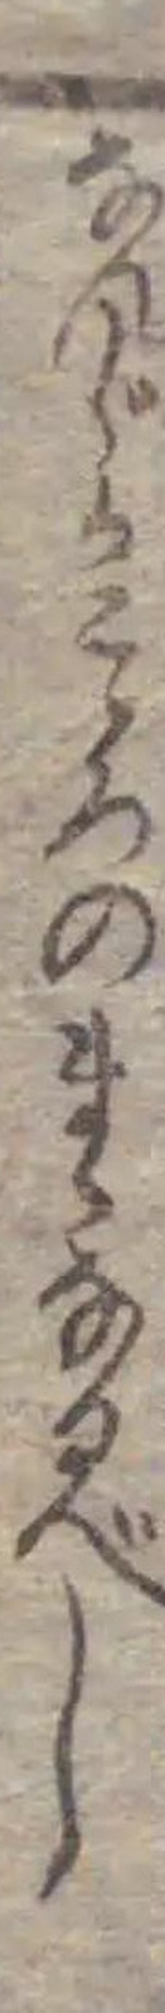なんじかこゝろのまゝなるべし

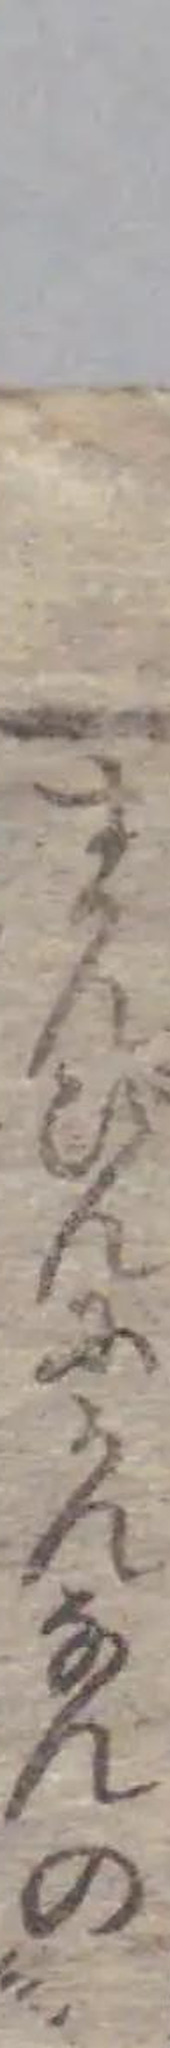すかんびんにかんなんの
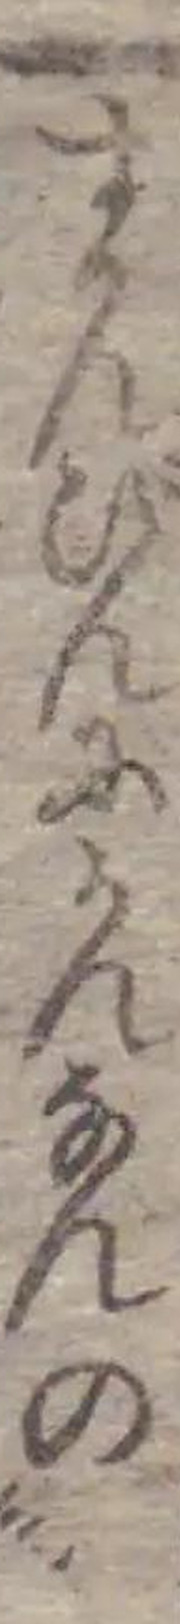すかんびんにかんなんの
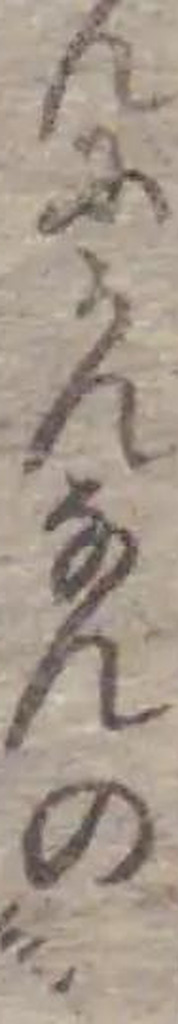これもかんなんの
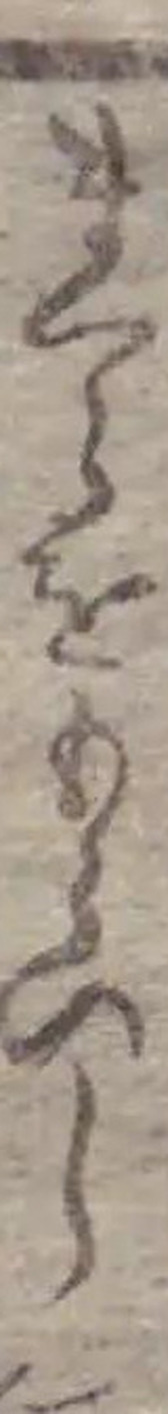まくらをもらいし
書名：かんなんの夢枕 2巻
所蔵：国立国会図書館 National Diet Library, JAPAN
